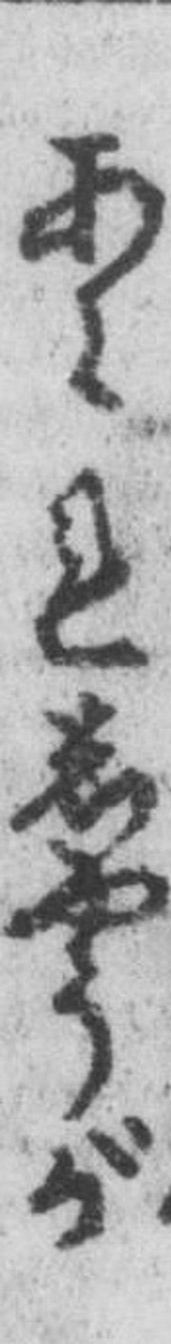あられしやうが
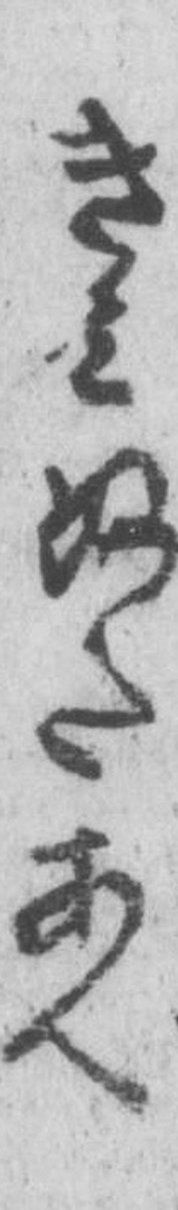きミぬたあへ

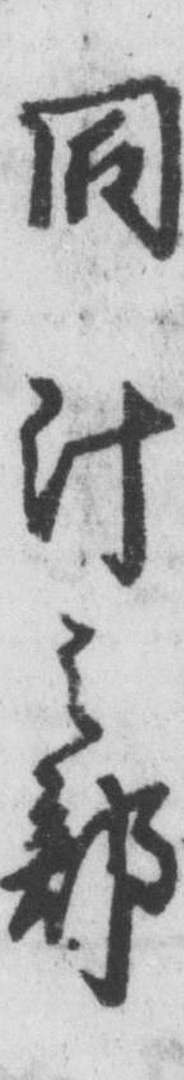同汁之部
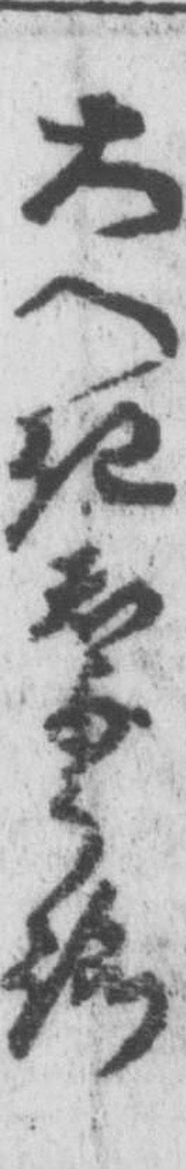大へきしやうろ
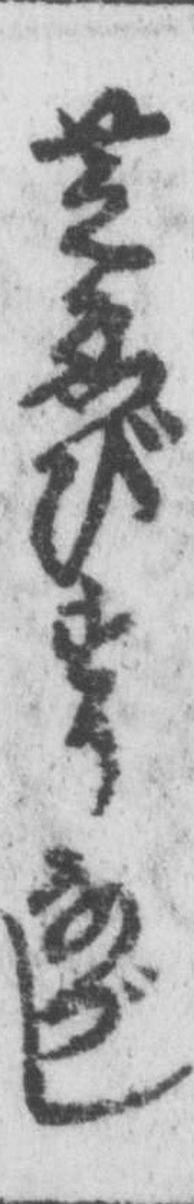芝ゑびすりながし
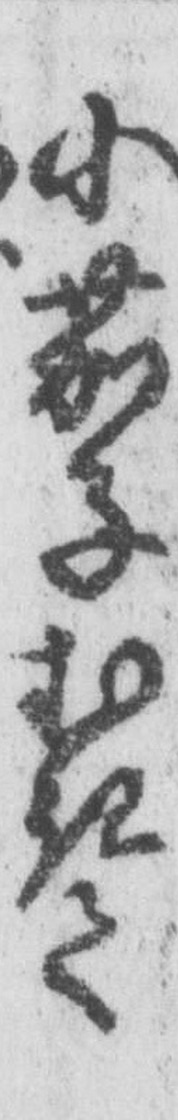小茄子むきて
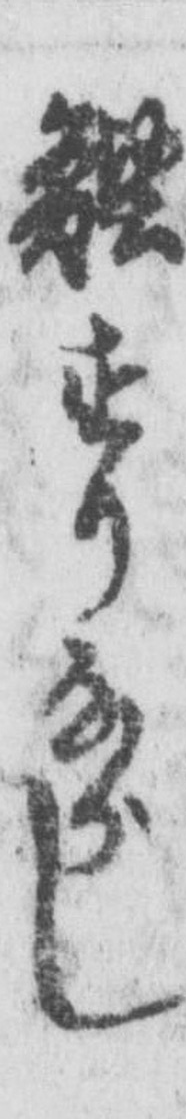鰹すりなかし
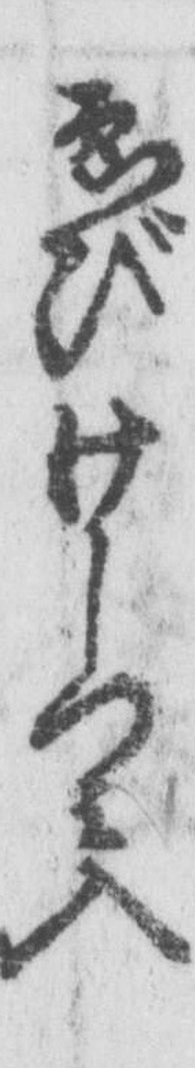ゑびけしつミ入
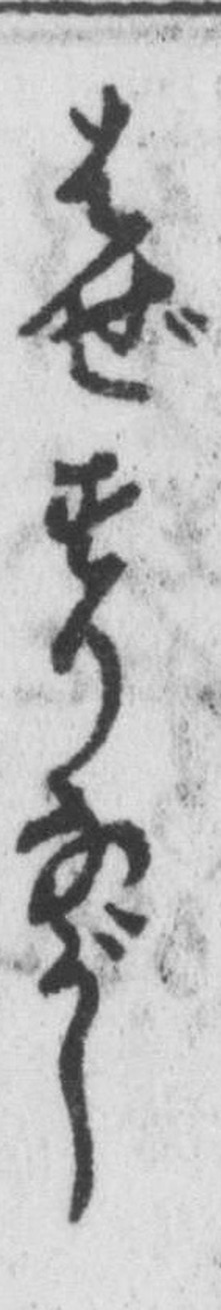芝ゑびすりながし
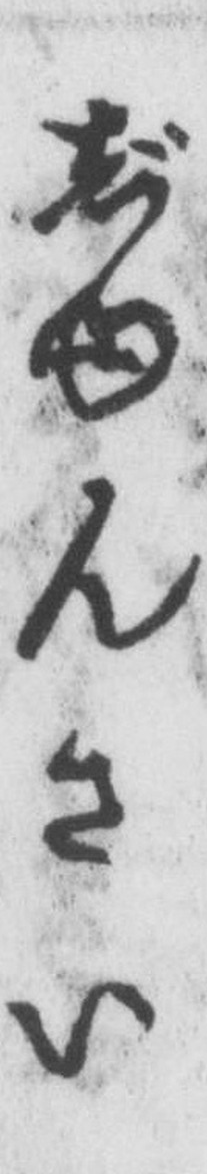じゆんさい
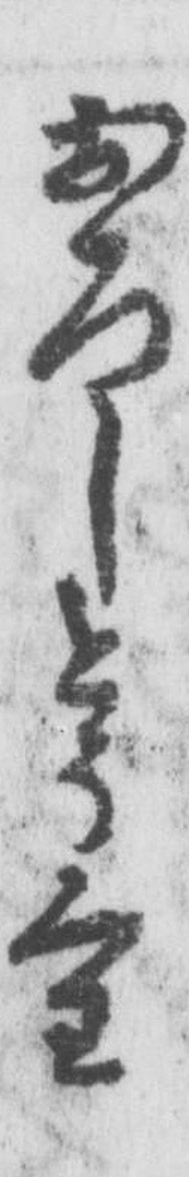おろしとうくわ
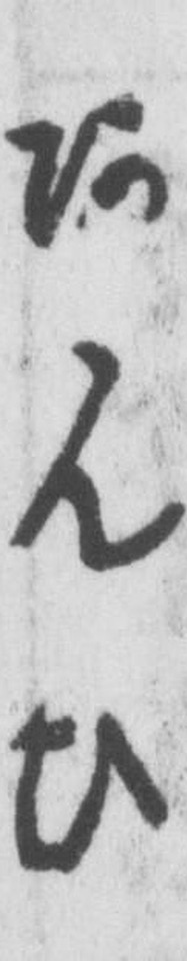あんひ
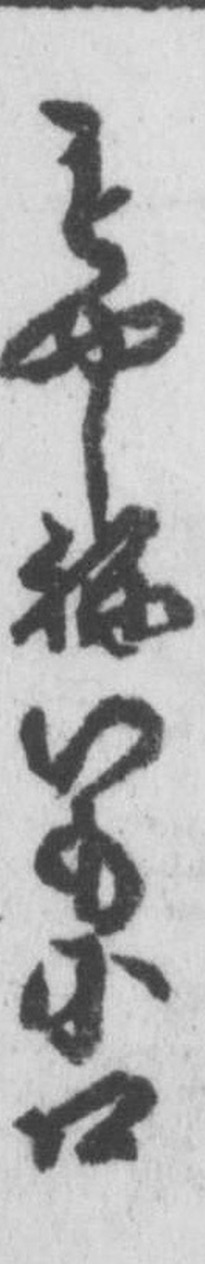もやしねいも小口
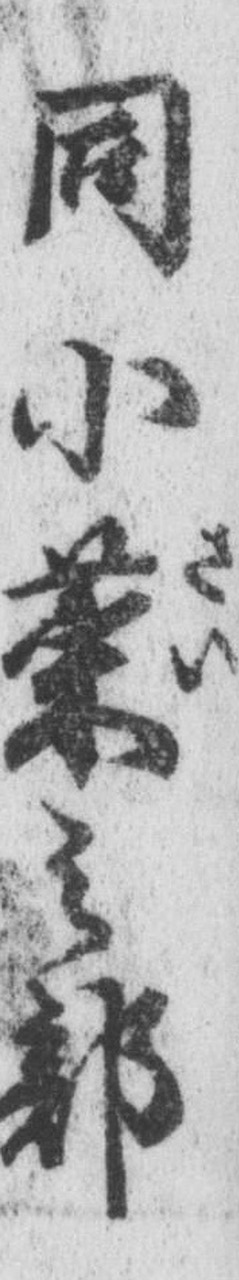同小菜之部
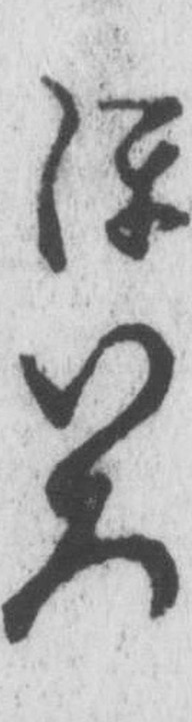ほいろ
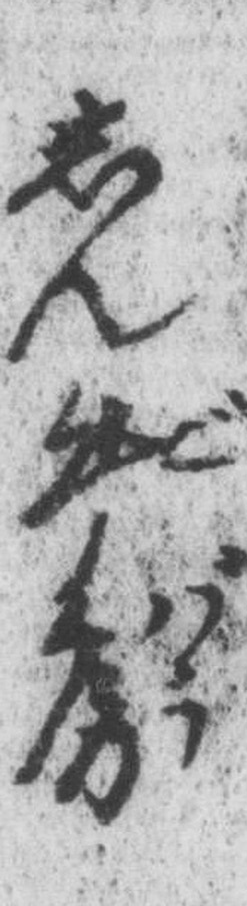しん午房
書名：当世料理献立
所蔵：大阪府立大学学術情報センター 国文学研究資料館
